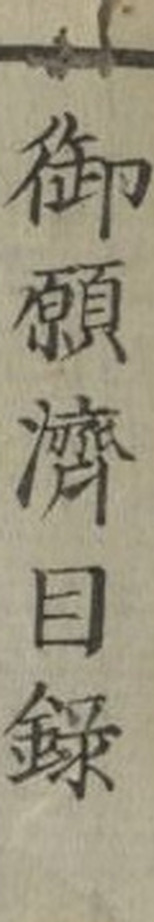御願済目録
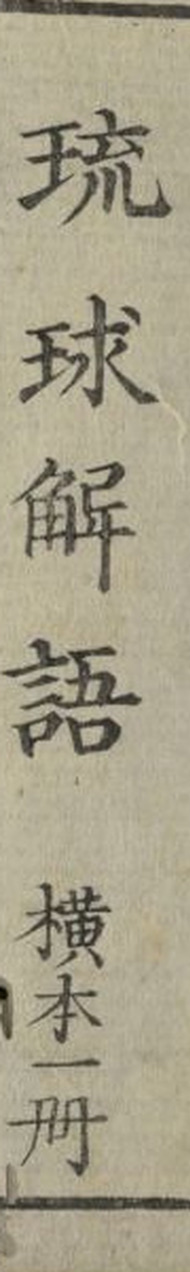琉球解語横本一冊
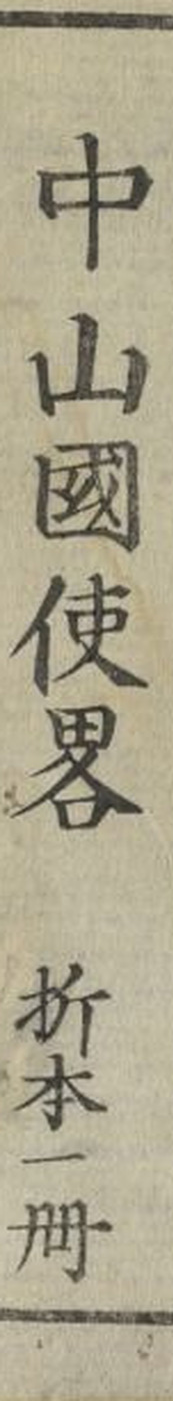中山国使略折本一冊
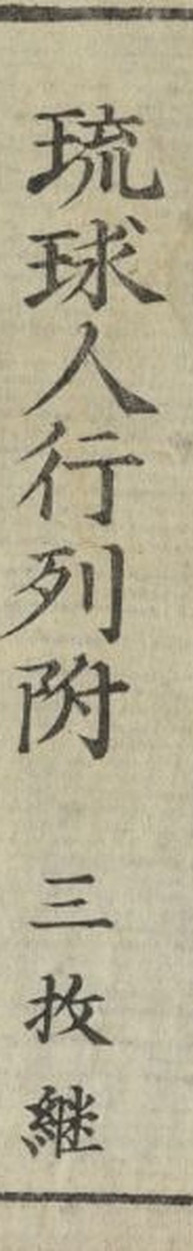琉球人行列附三枚継
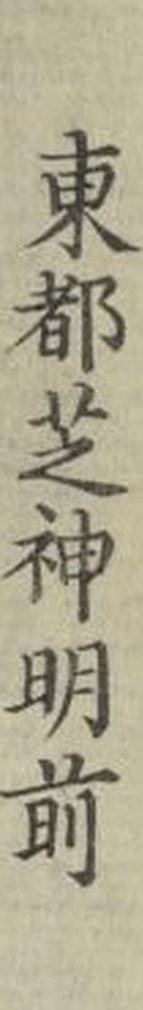東都芝神明前
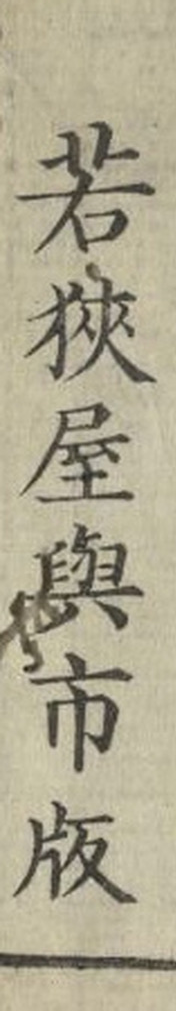若狭屋與市版
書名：琉球解語
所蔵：University of the Ryukyus Library
